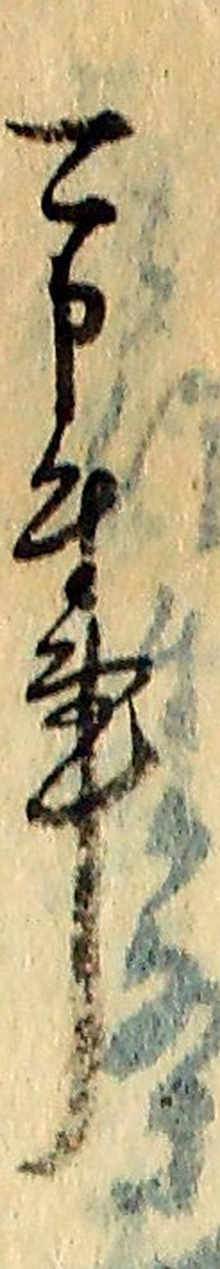可申付事
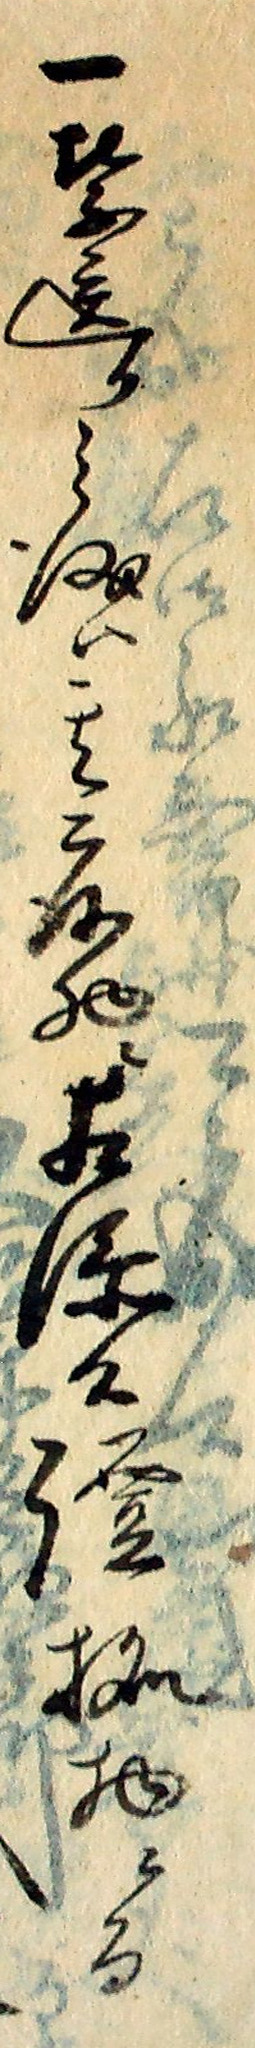一葉送り之儀は其荷物に相添候証拠物にて
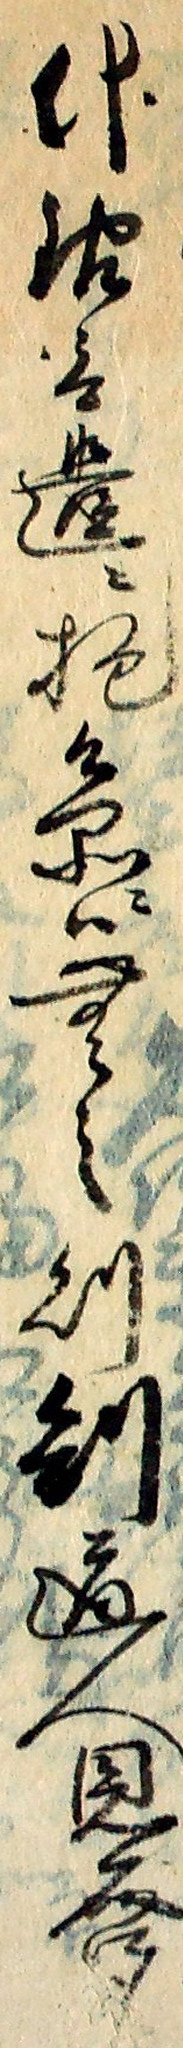代銀取遣に拘候品には無之則刻通人見咎め
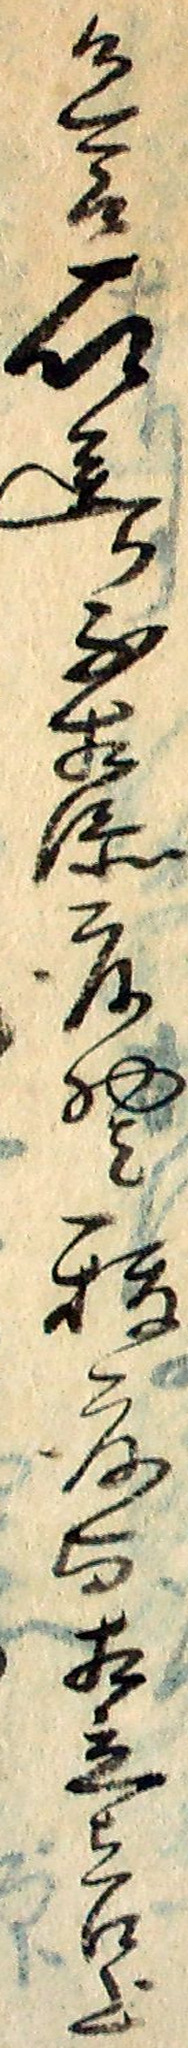候節右送り不相添荷物は抜荷と相立被召上
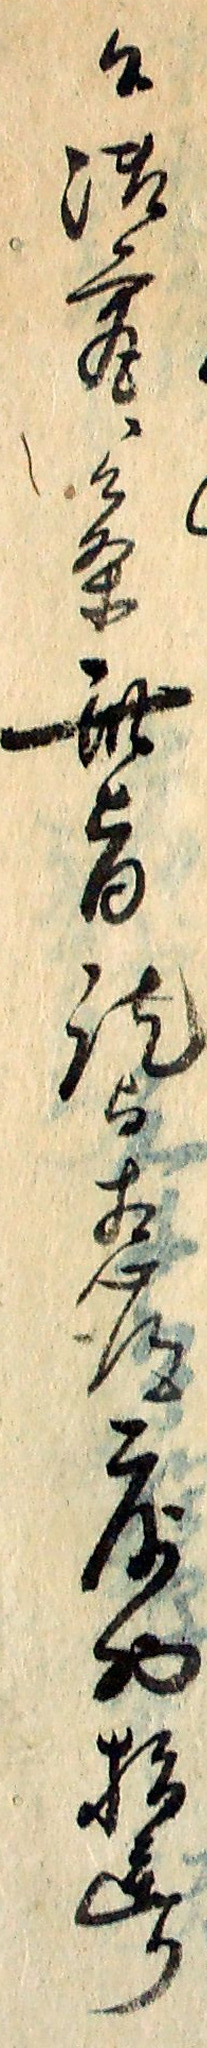候御究に候条此旨然と相心得荷物指送り

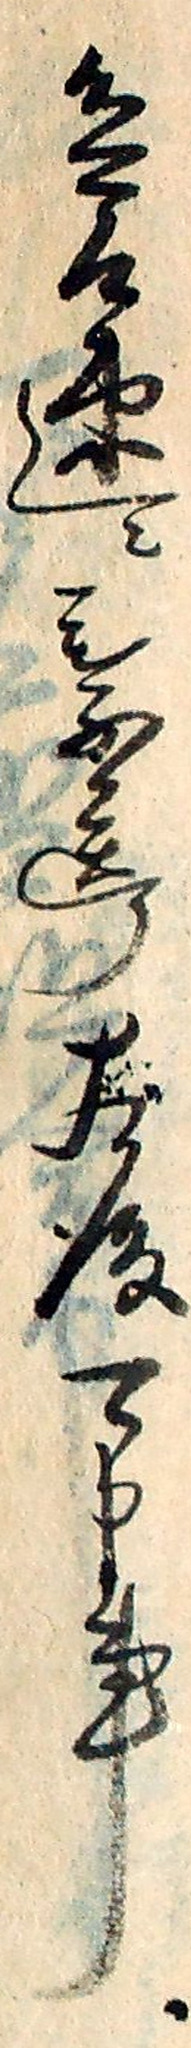候節速に葉送り相後可申事
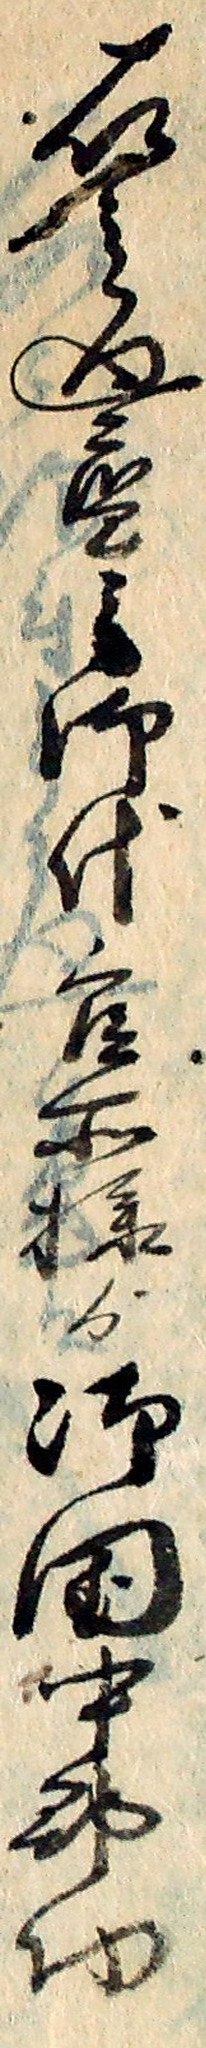右之通藍方御代官所様ゟ御国中郡切
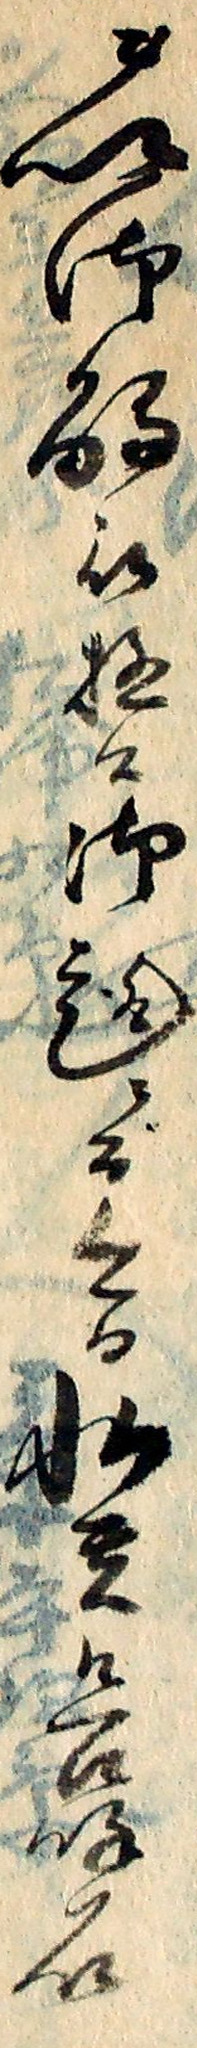を以御触被遊候御趣にて今日私共被召呼右
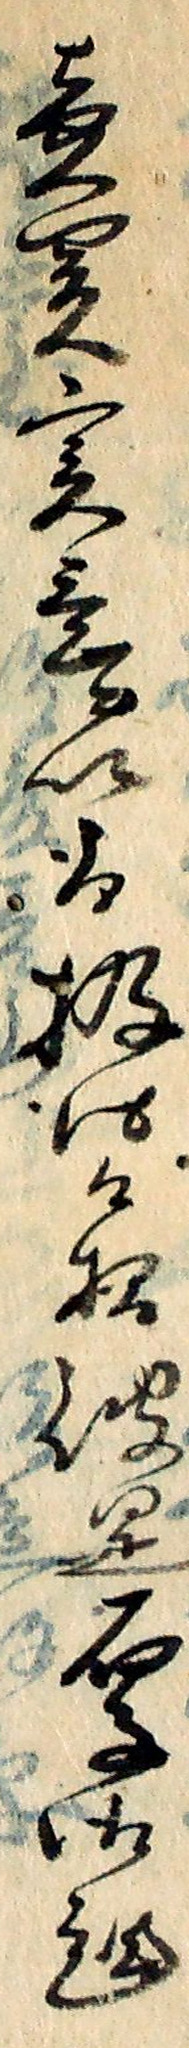売買実意を以取扱仕候様彼是厚御趣
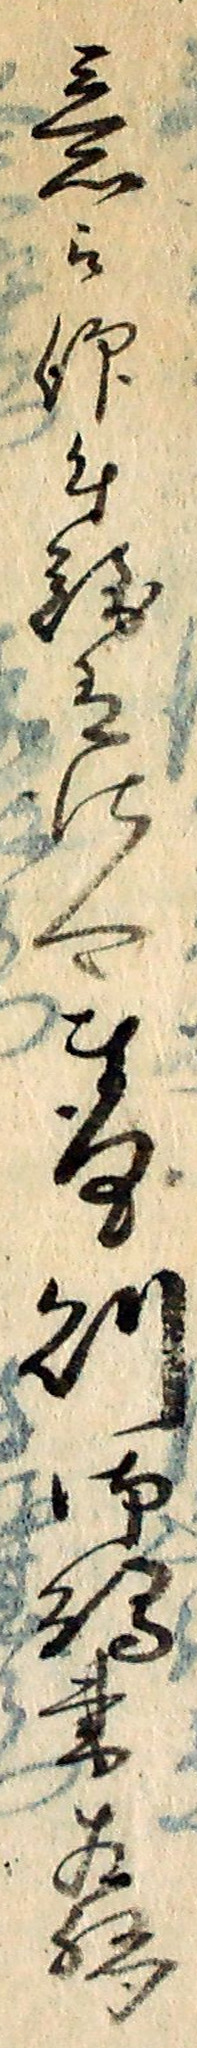意被仰付難有仕合奉存候則御触書相認め
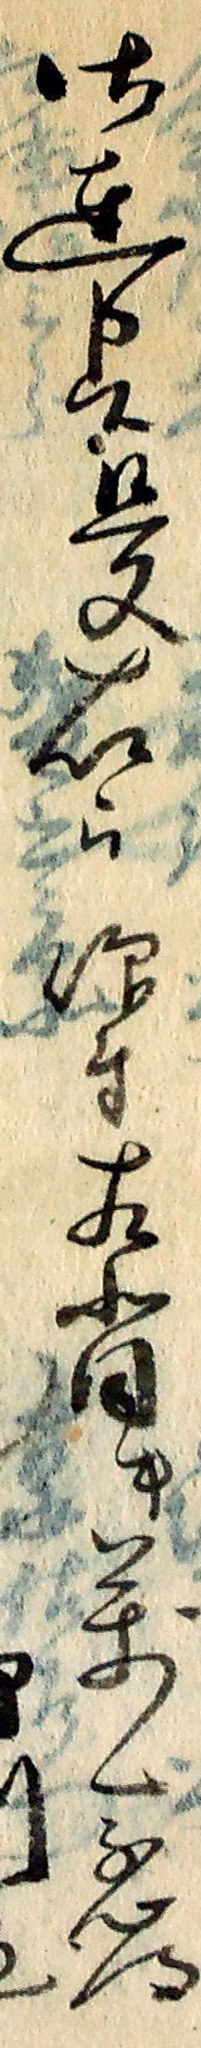御達申候且又右被仰付相背き万一不心得
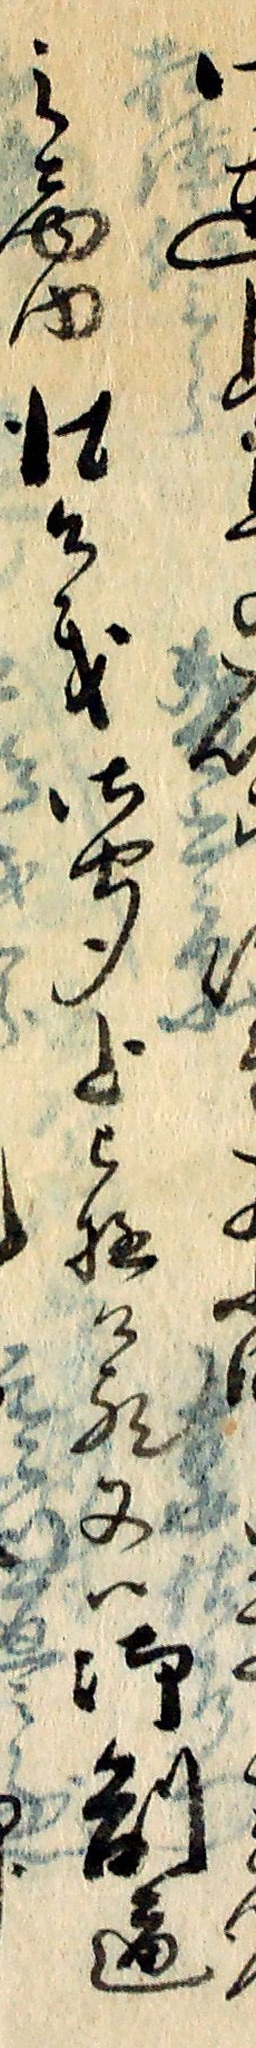之商内仕候義御聞上被遊候か又は御制通
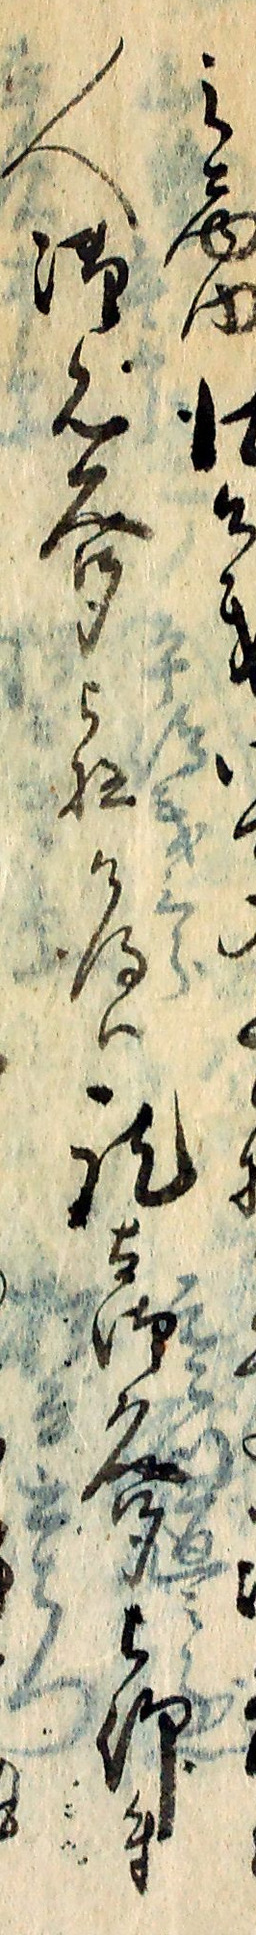人御見咎め被遊候得は然と御咎め被仰付
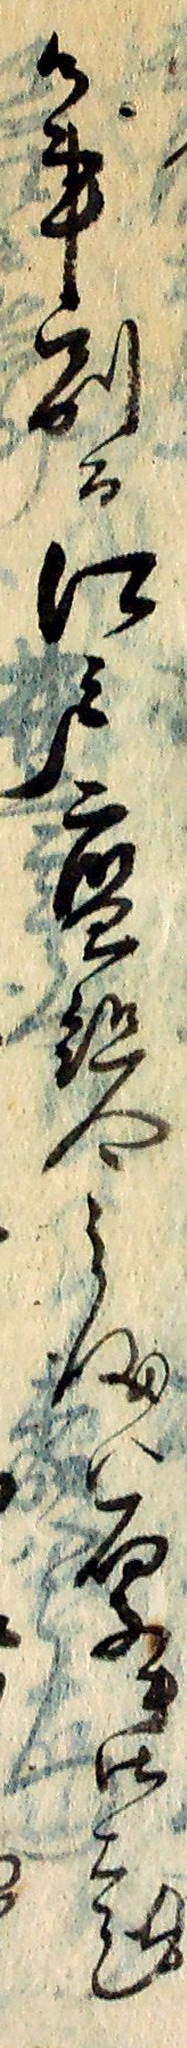候事別て江戸藍組合之儀は厚き御趣
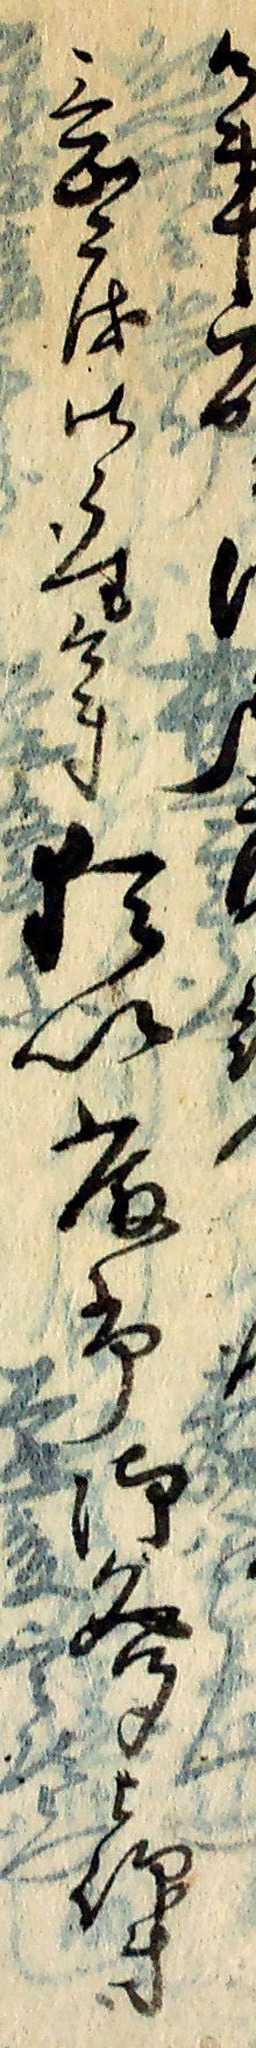意も御座候付猶以厳布御咎め被仰付
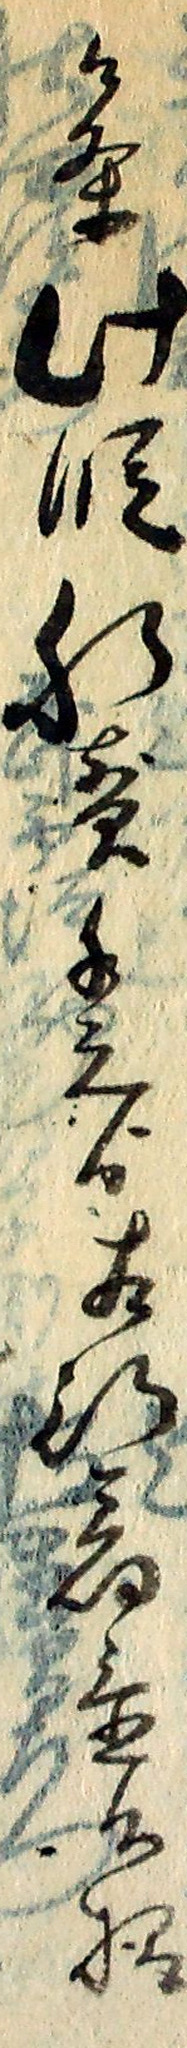候条此段肝煎手元ゟ相行着置候様
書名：諸御願書控(後藤氏壱番）
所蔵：鳴門教育大学 Naruto University of Education
